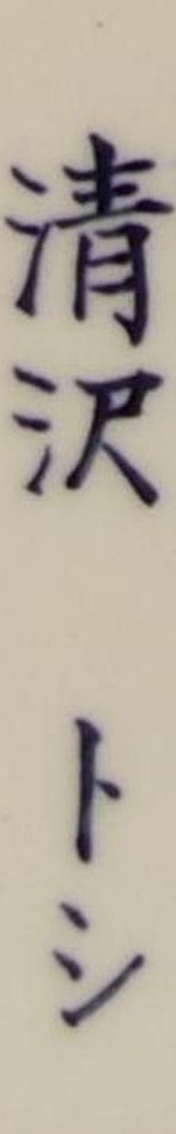清沢トシ
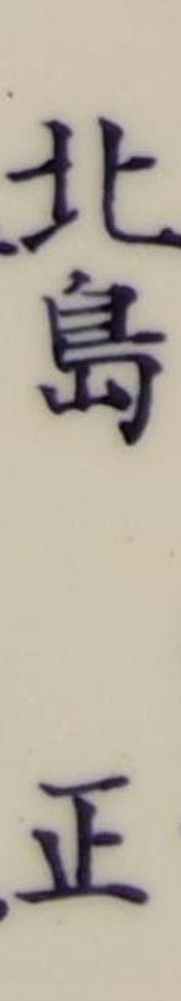北島正
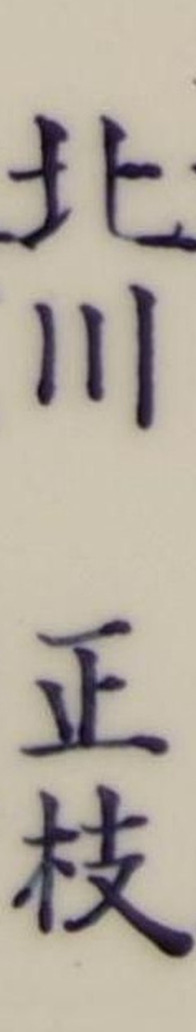北川正枝
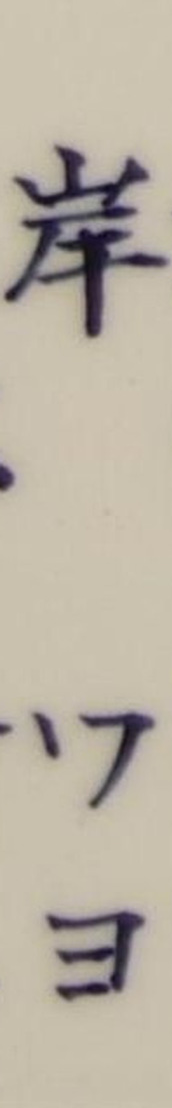岸ワヨ

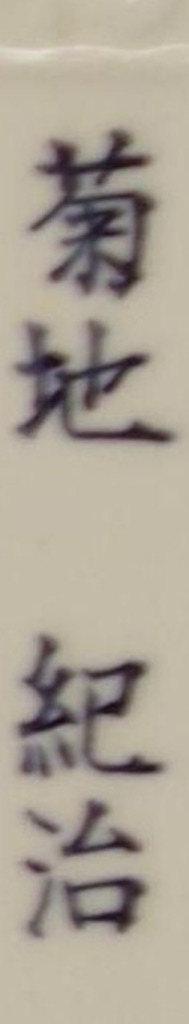菊地紀治
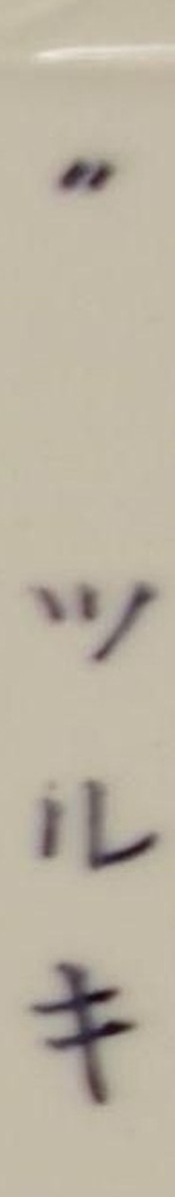ツルキ
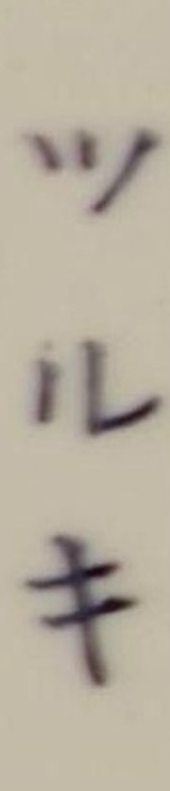ツルキ
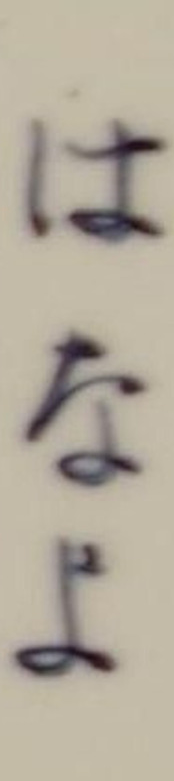はなよ
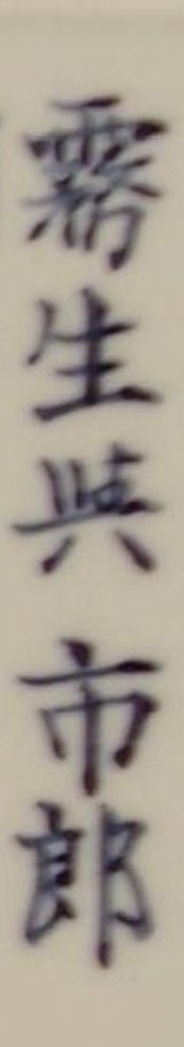霧生与市郎
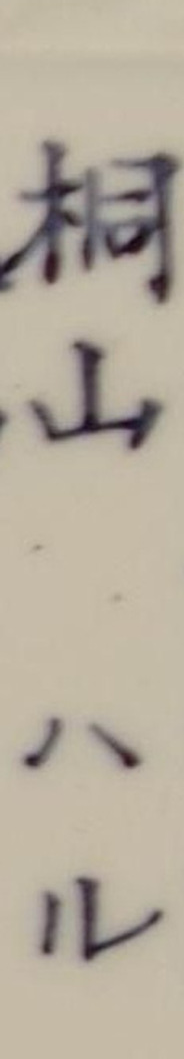桐山ハル
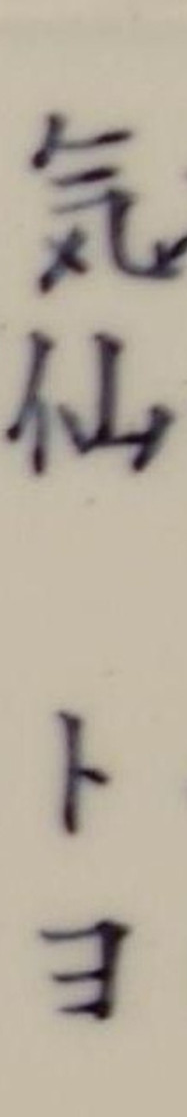気仙トヨ
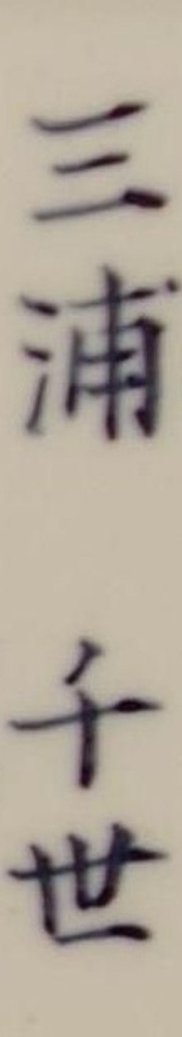三浦千世
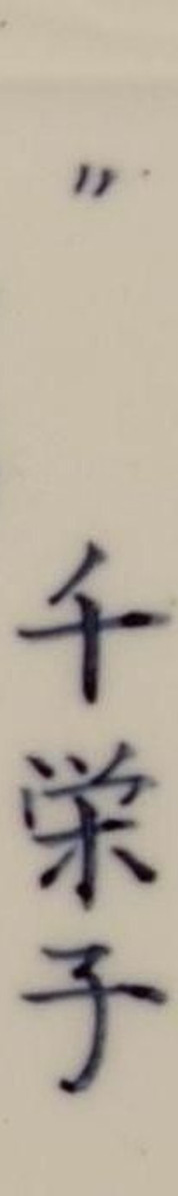千栄子
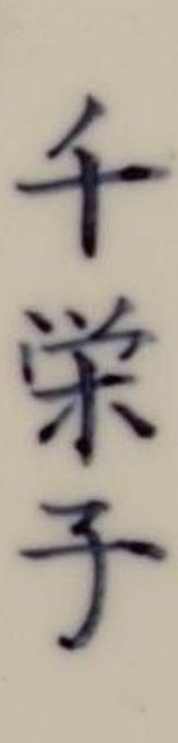千栄子
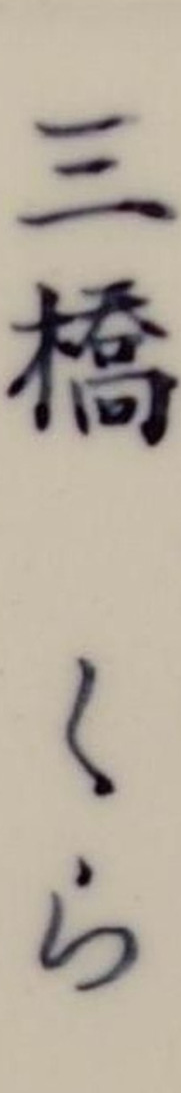三橋くら
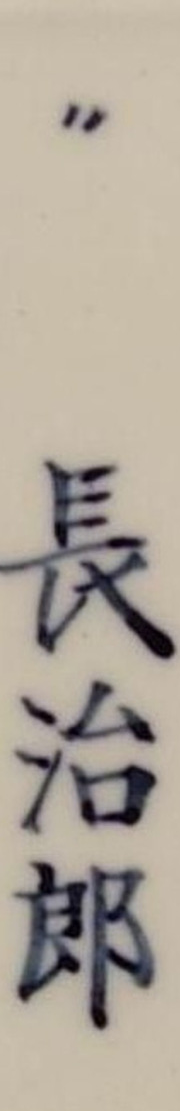長治郎
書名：M~S
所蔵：高野山金剛峯寺
